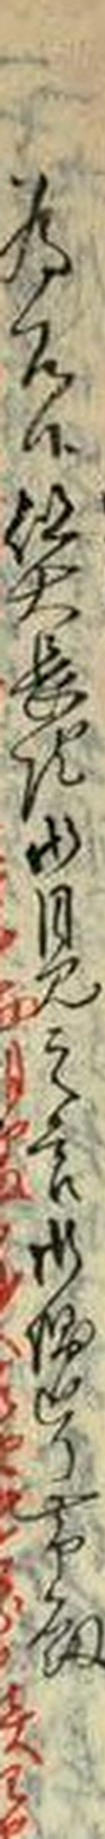為召候但大長院御目見之節御側廻り帯剣
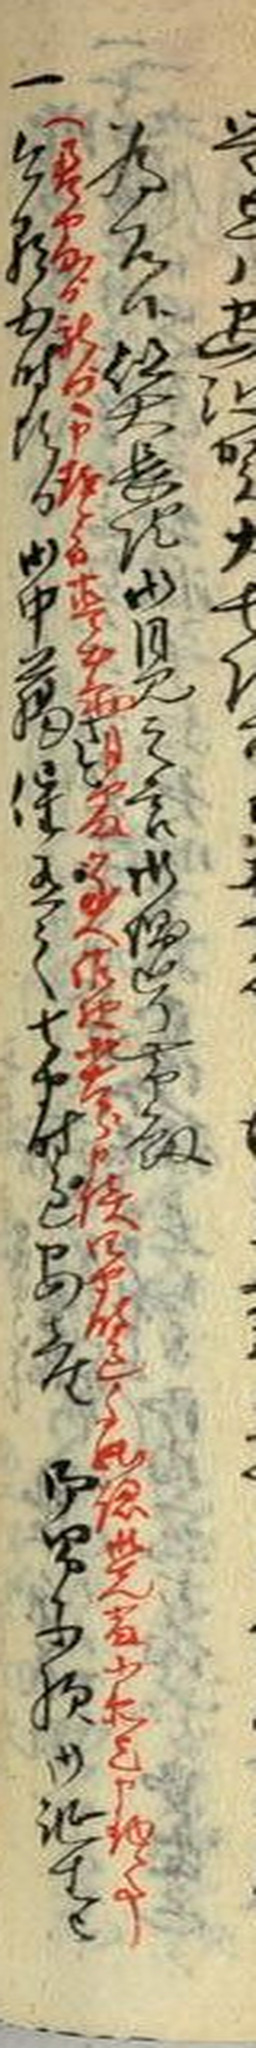一今朝五時頃ゟ御中臈さと催有之七半時過安産御男子様御誕生被
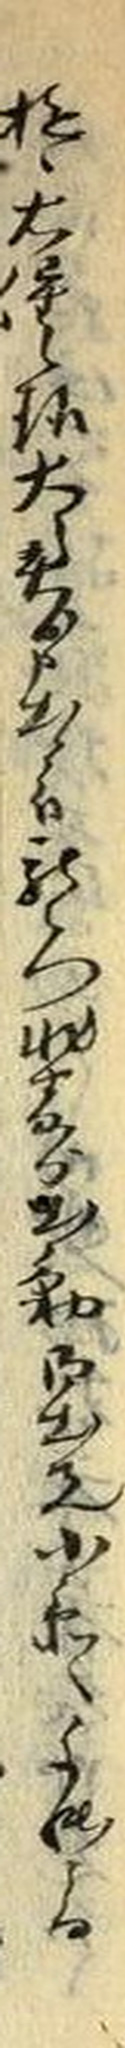遊候右催之趣大奥ゟ申出候ニ付新右衛門非番ゟ出勤御出先小兵衛へ手紙ニ而
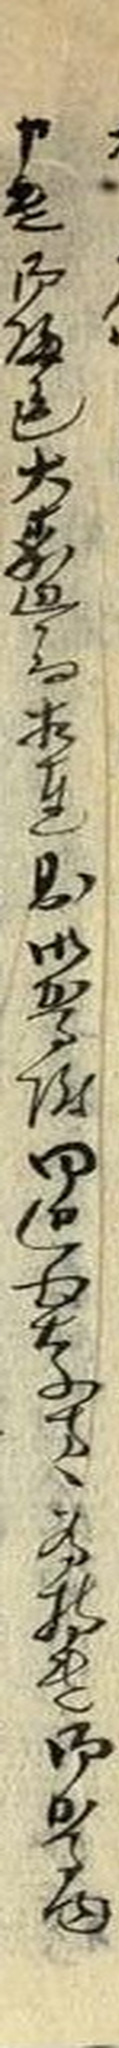申遣御帰道大森辺ニ而相達則御駕附田辺五太夫方へ為持遣御駕内
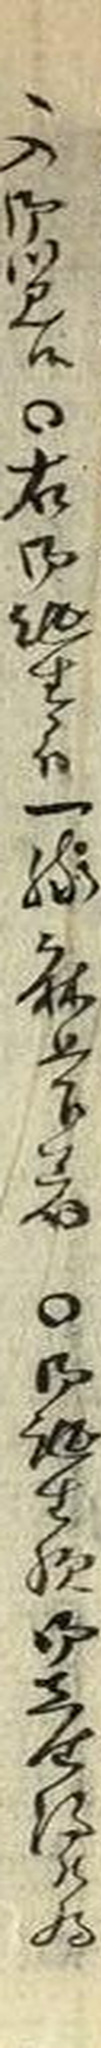へ入御覧候〇右御誕生ニ付一統麻上下着〇御誕生様御産湯被為
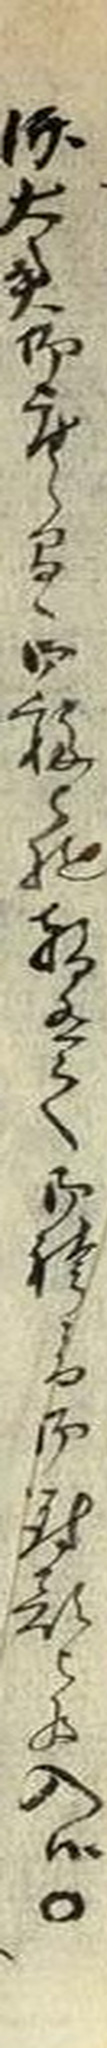済大奥御座之間へ御移被遊暫有之御袴ニ而御対顔被為入候〇
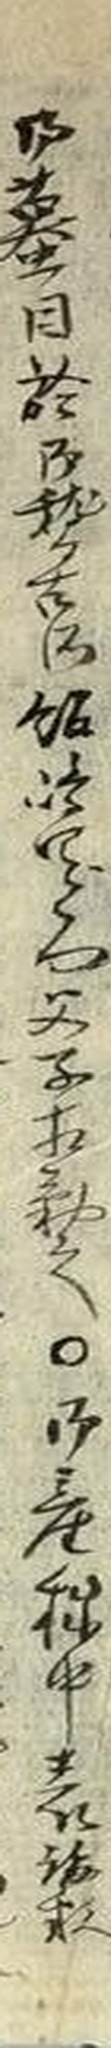御蟇目於御稽古所飯嶋四郎右衛門父子相勤之〇御産穢中表講釈
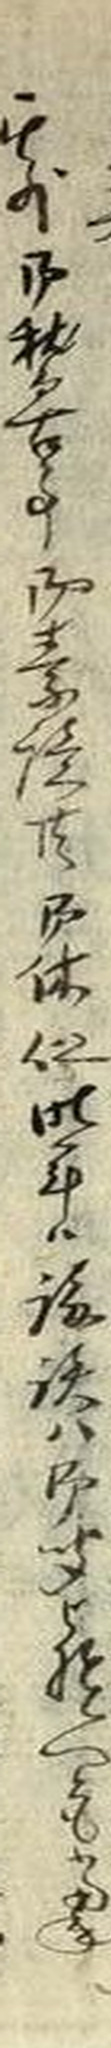其外御稽古事御素読共御休但昨年ハ講談ハ御聞被遊候へとも当年
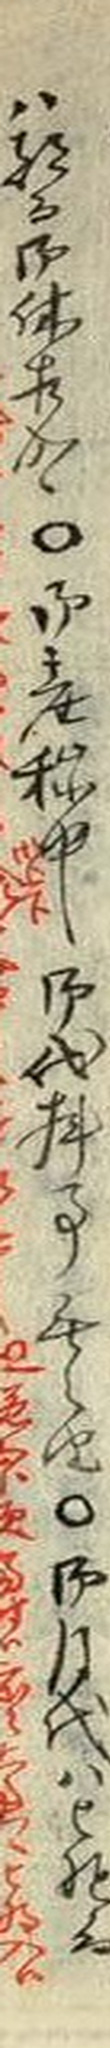ハ都而御休相成候〇御産穢中御代拝事無之由〇御月代ハ被遊候而
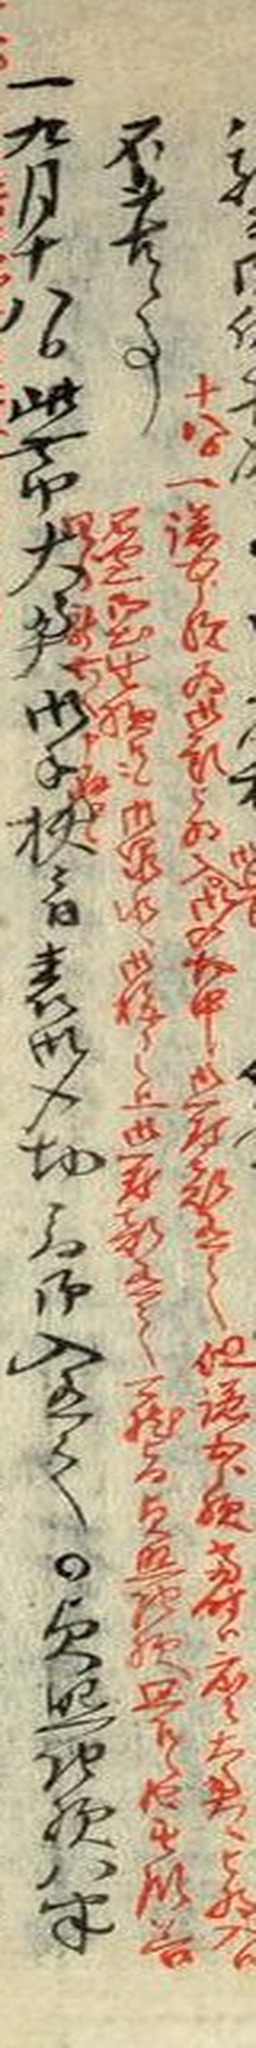一九月十八日此節大奥御手狭ニ付表御〆切ニ而御入有之〇貞照院様八半
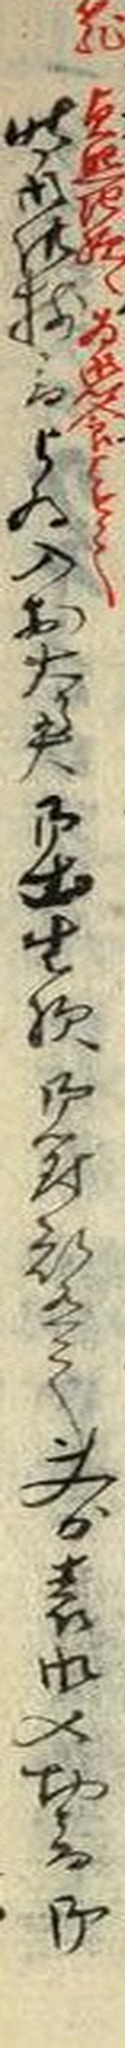時御供揃ニ而被為入於大奥御出生様御対顔有之夫ゟ表御〆切ニ而御
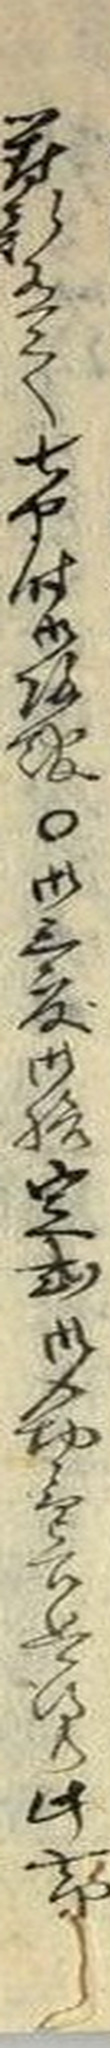対顔有之七半時御帰館〇御三度御膳定式御〆切ニ而被召上候得共此節
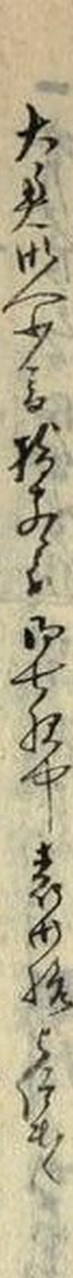大奥御人少ニ而指支候ニ付御七夜中表御膳被仰出候
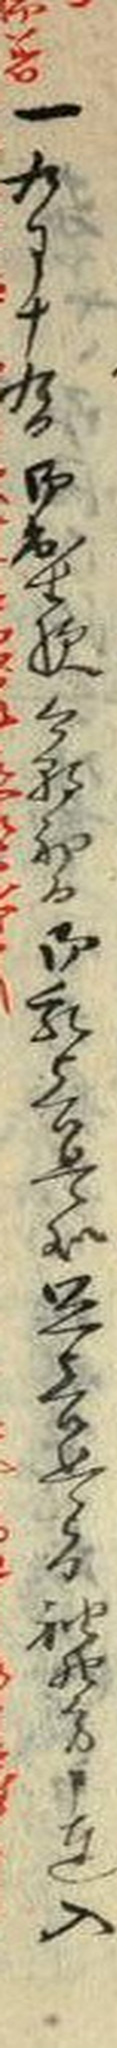一九月十九日御出生様今朝初而御乳被召上候処足被召上候旨袖野方申達入

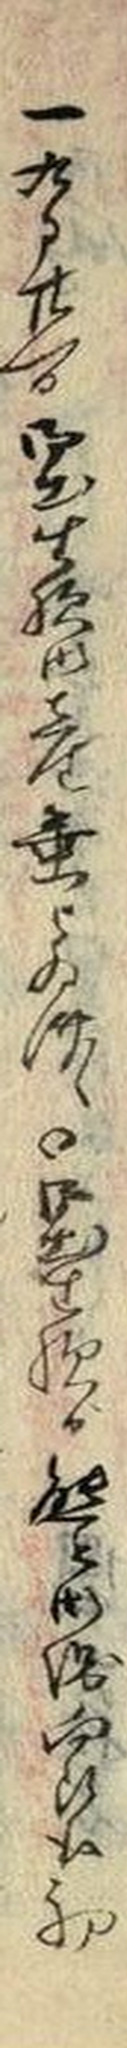一九月廿一日御出生様御産被為済候〇御出生様ゟ態と御側向頭取初
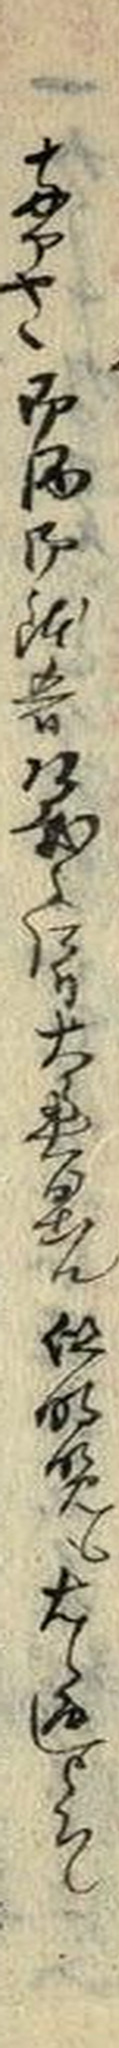両部やへ御酒御鉢肴頂戴被仰付大奥ゟ出ル但明晩も右之通被下候
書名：少傅日録抄（斉承付側向頭取日記、在国）
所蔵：福井県文書館 Fukui Prefectural Archives
